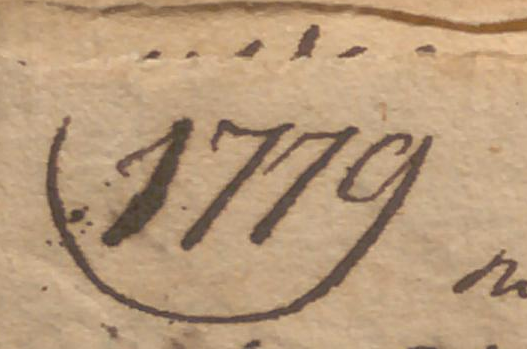1779
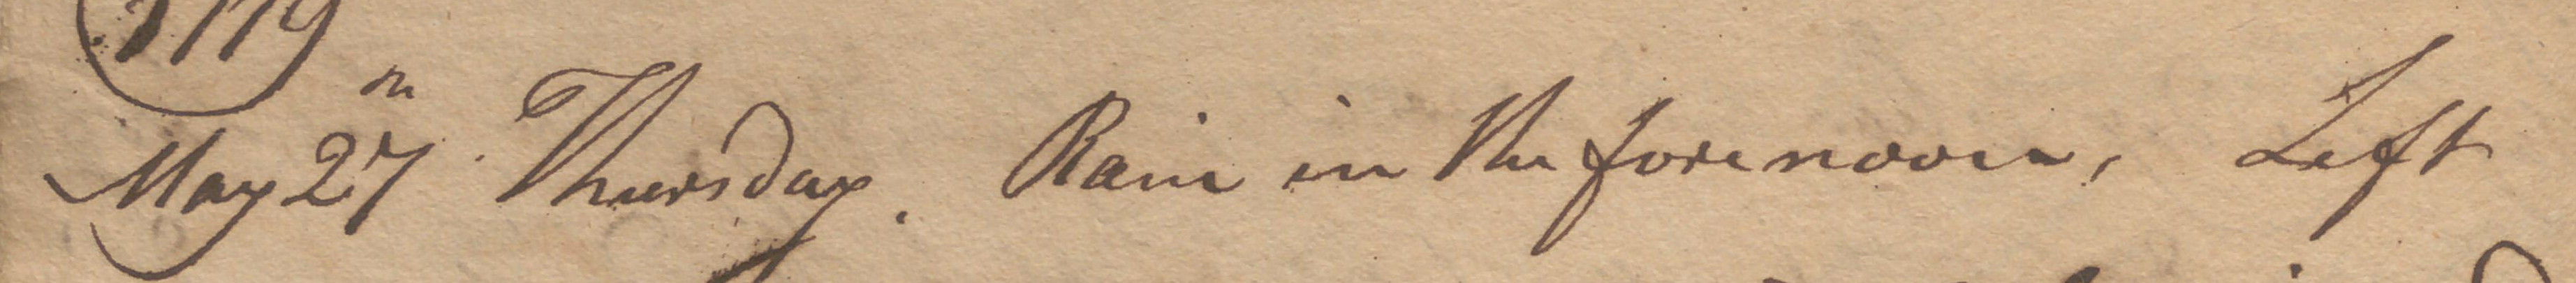May 27^th Thursday Rain in the forenoon, Left
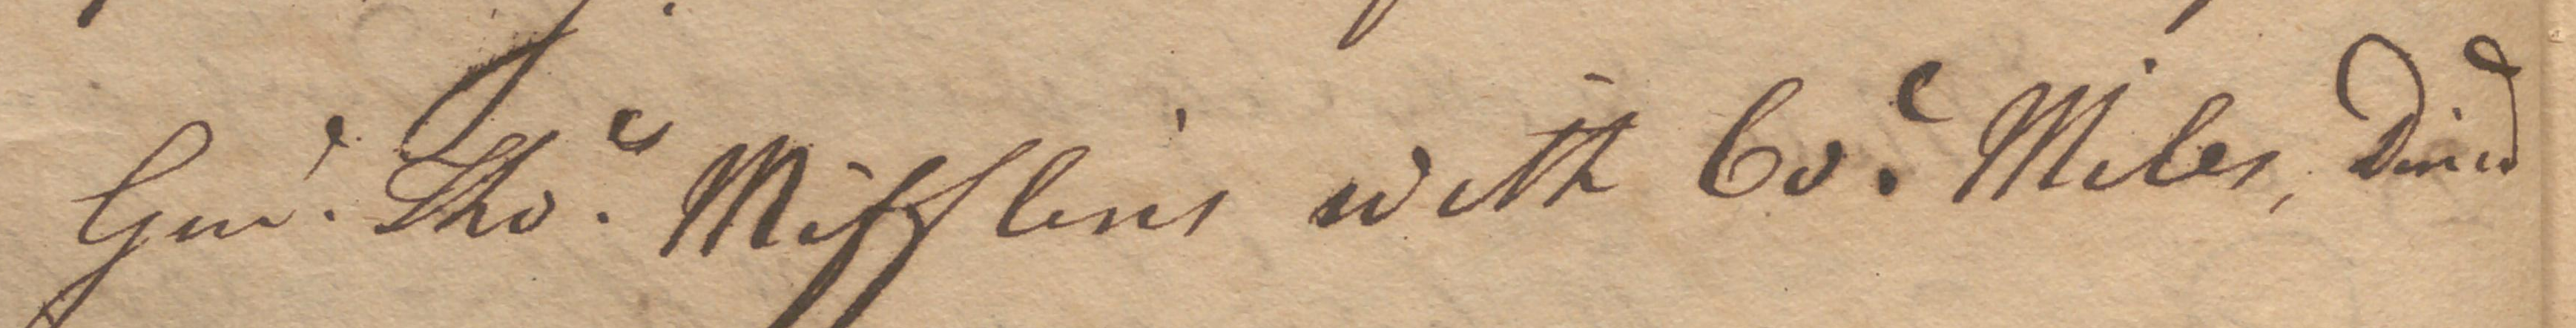Gen^l. Tho^s. Mifflins with Co^l. Miles, Dined
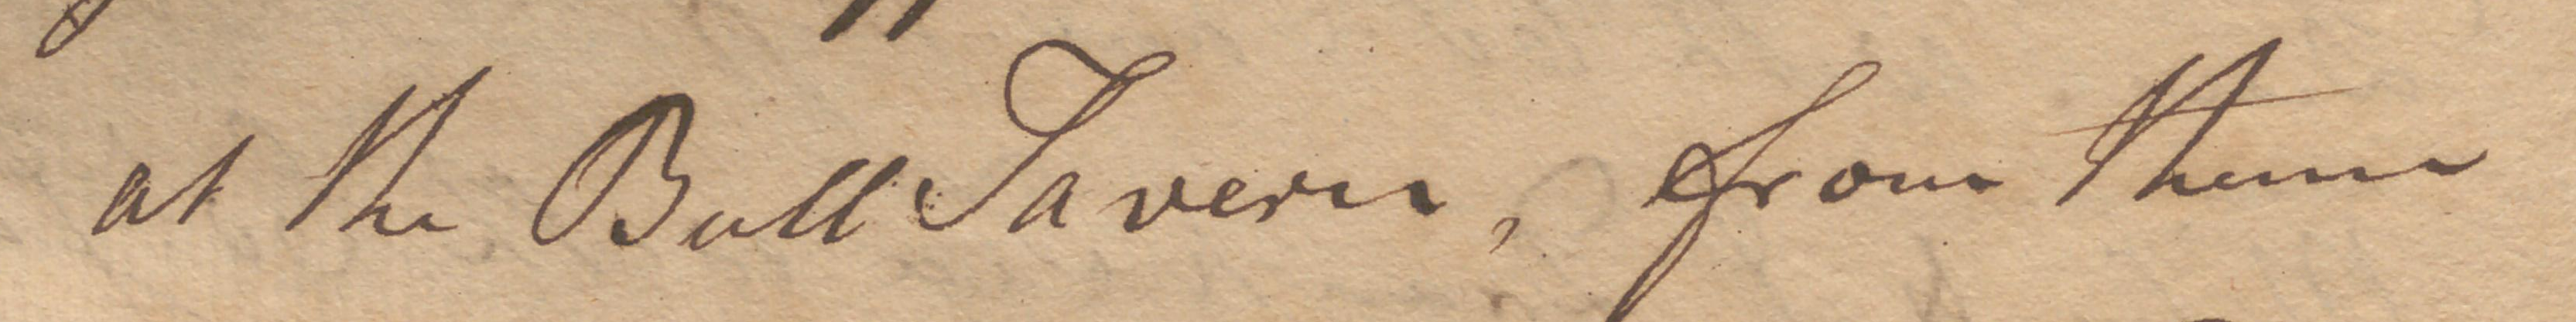at the Bull Tavern, from thence
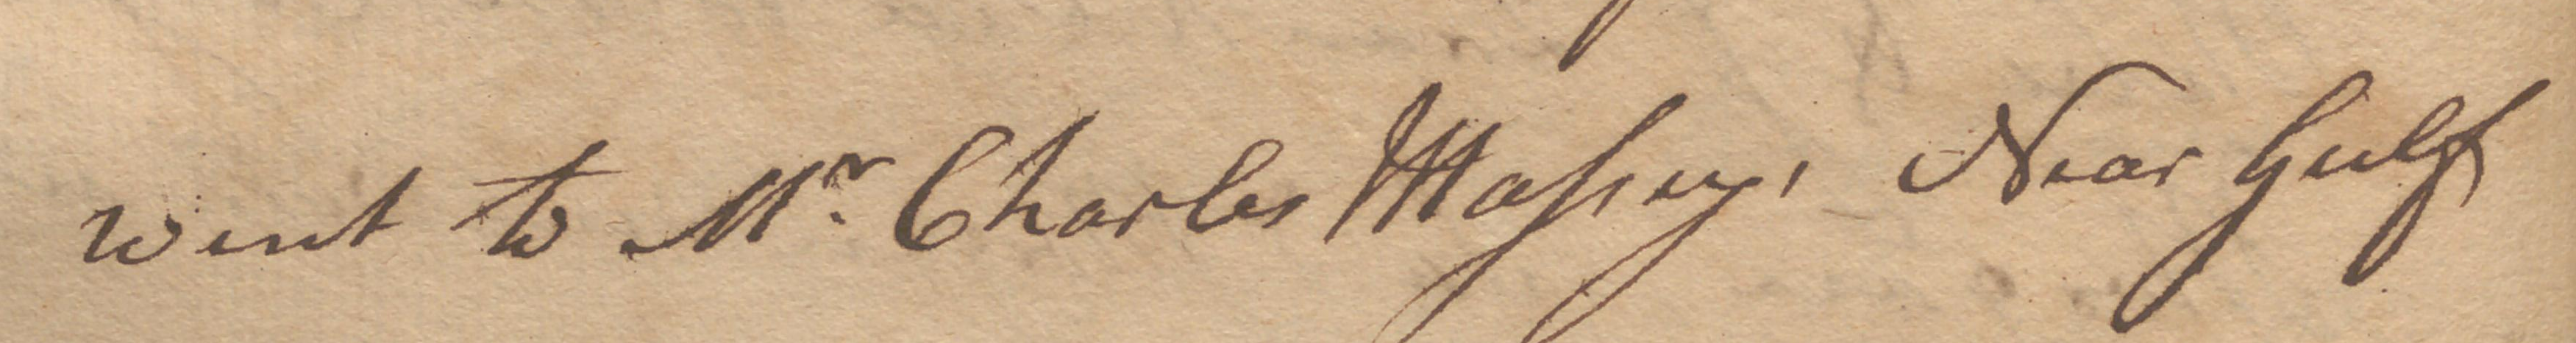went to M^r. Charles Massey. Near Gulf
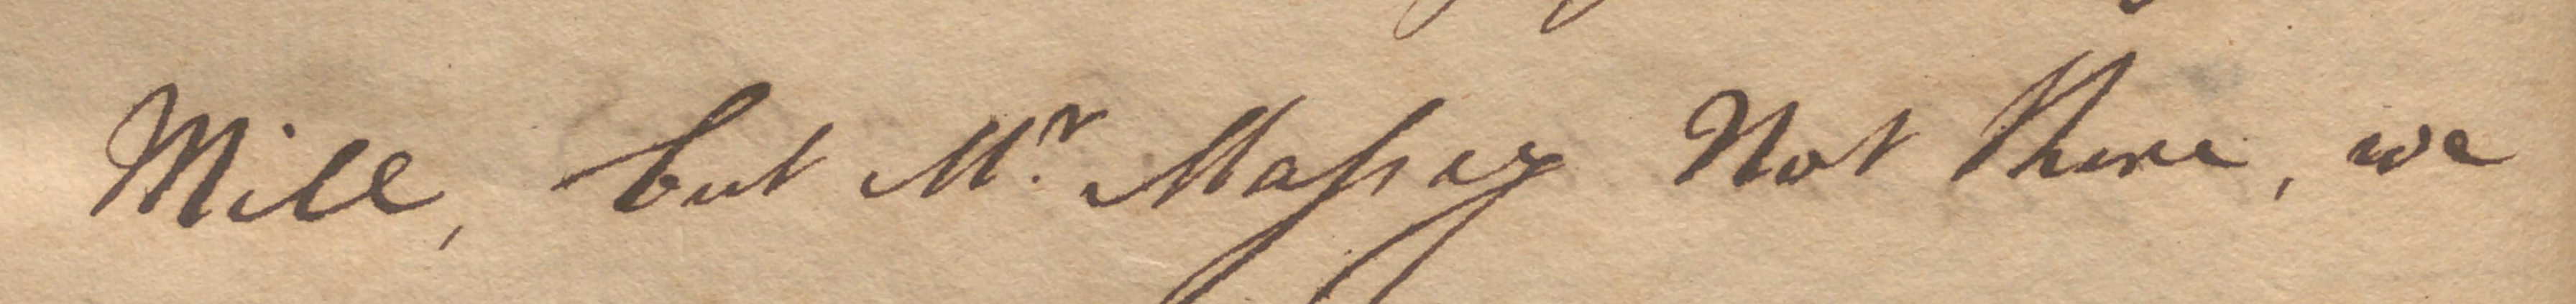Mill but M^r. Massey Not there, we
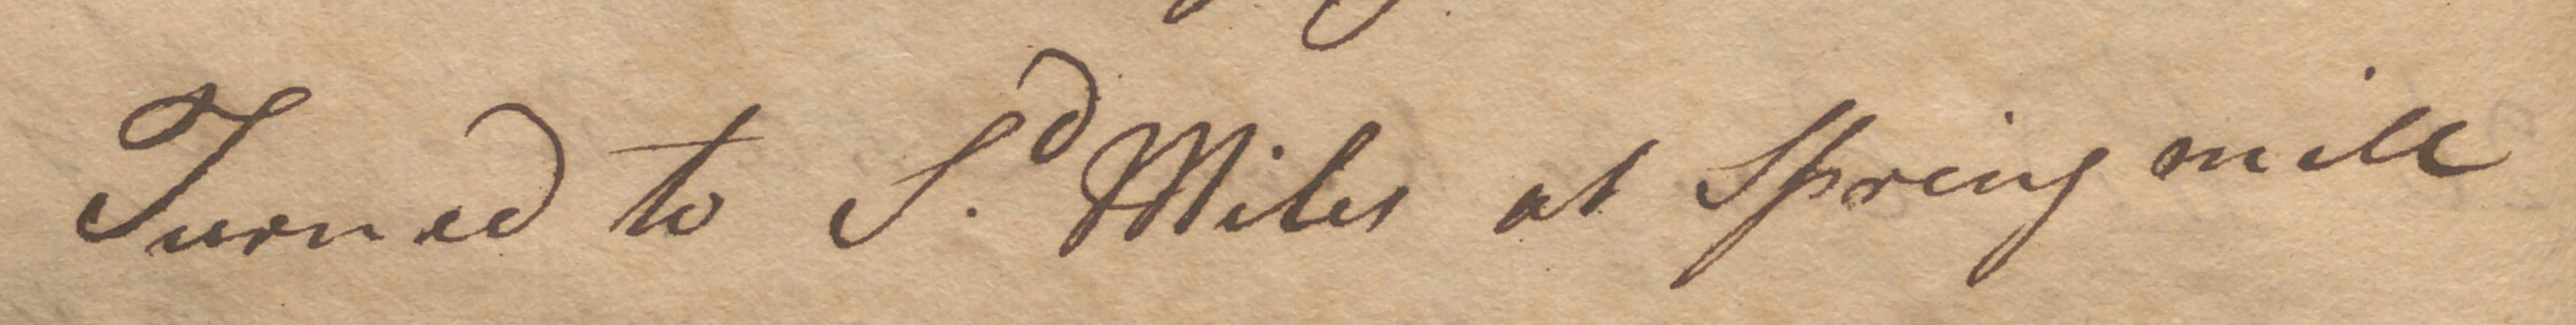Turned to S^d. Miles at spring mill
